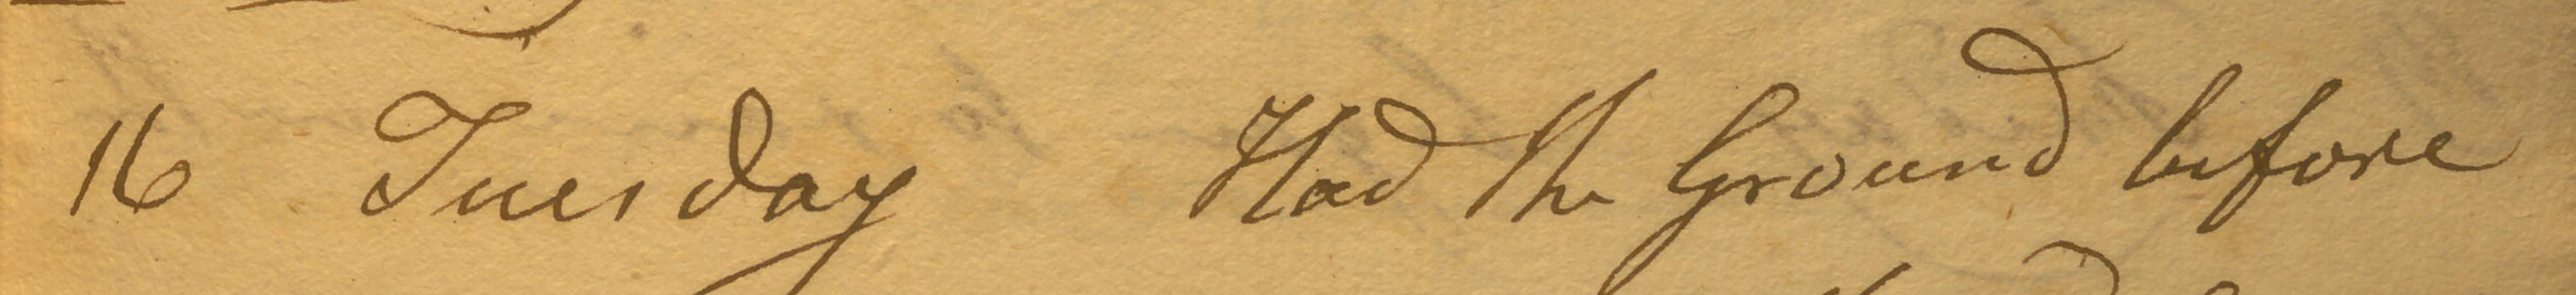16 Tuesday Had the Ground before
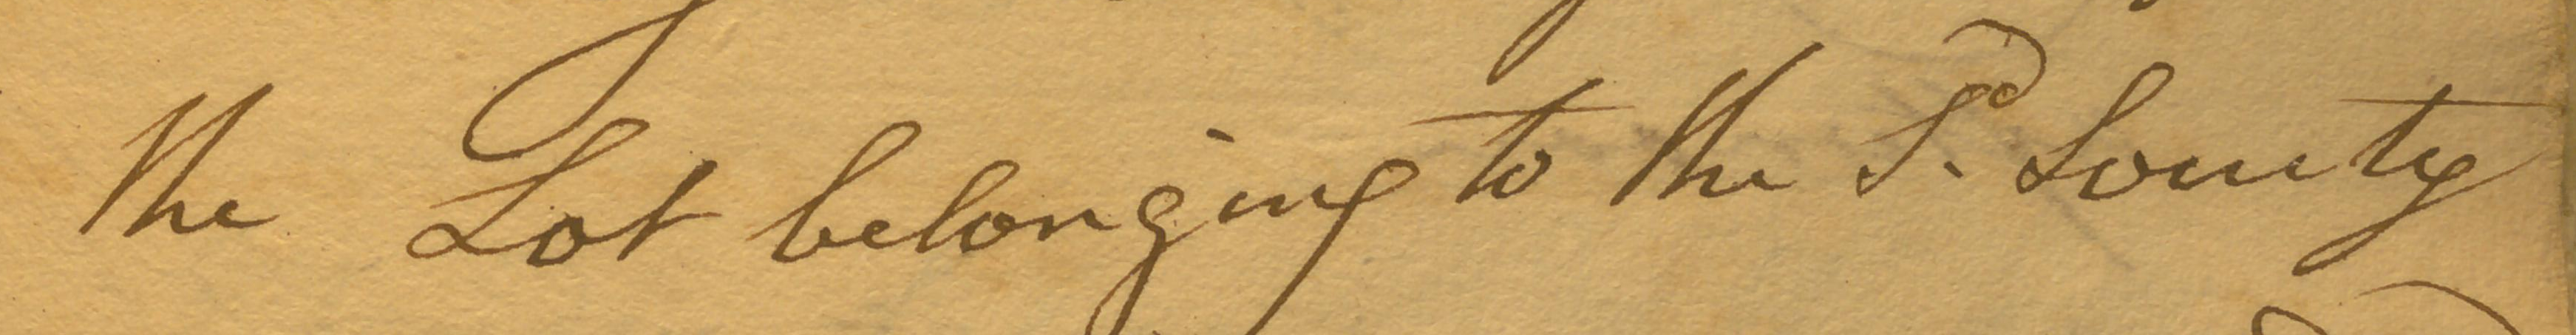the Lot belonging to the S^d. Society
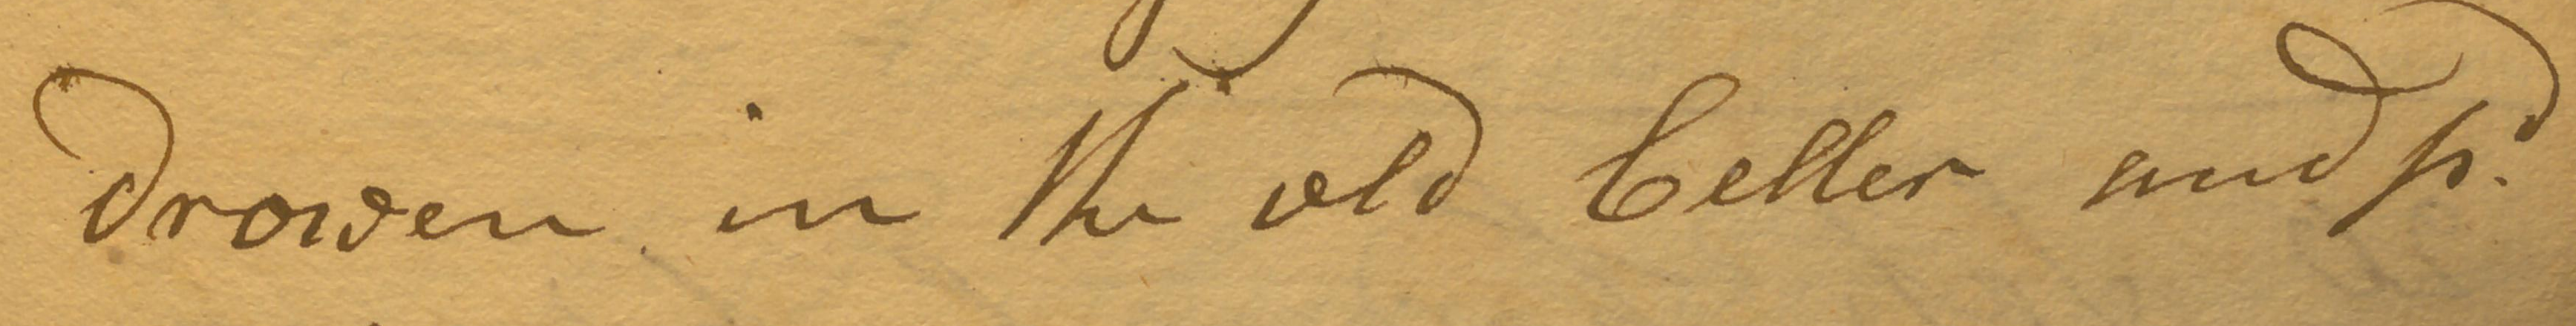drowen in the old Celler and p^d.
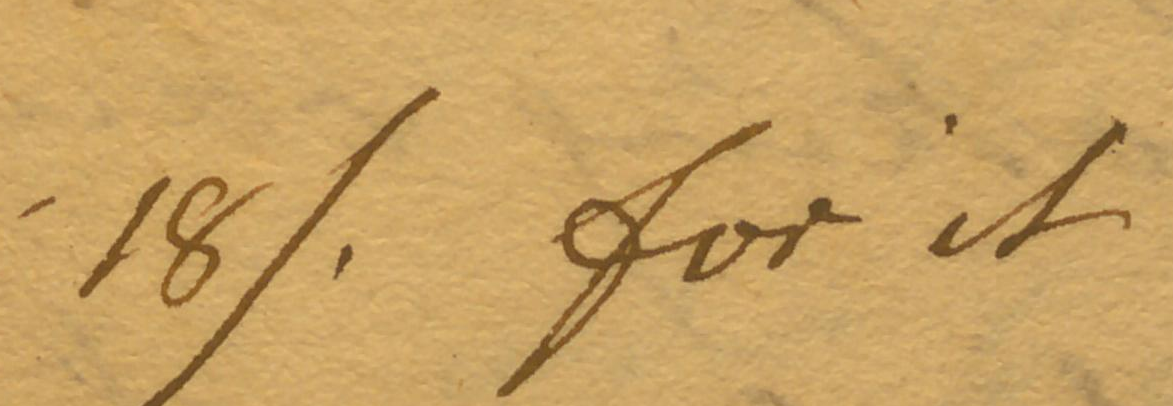18s. for it
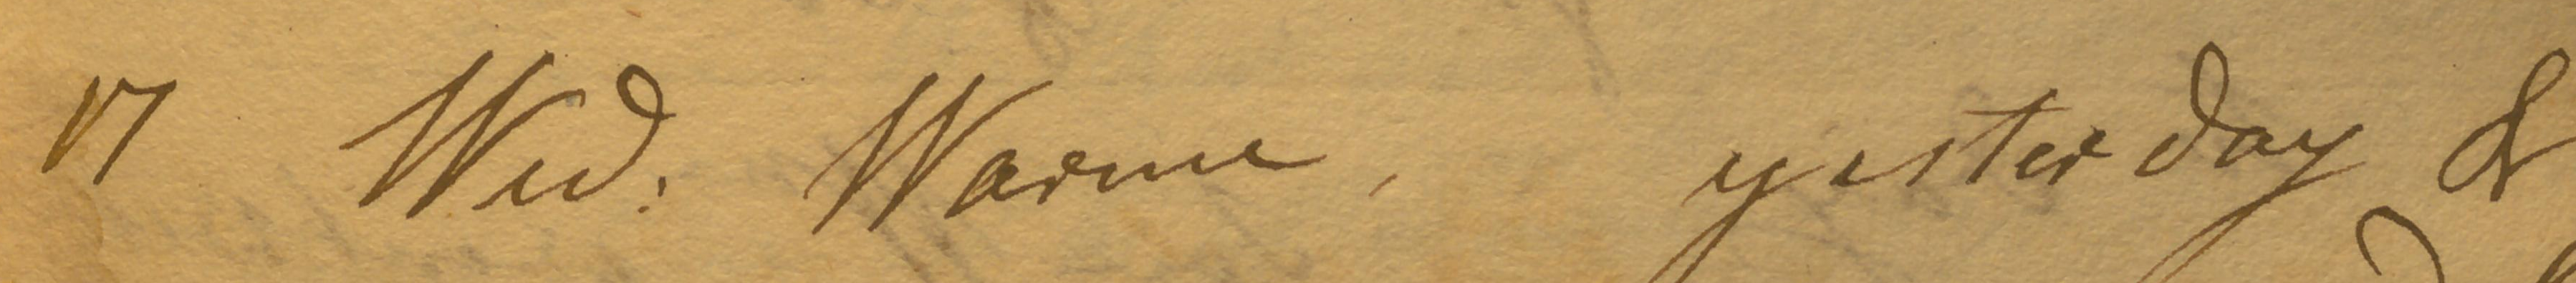17 Wed. Warme, yesterday &
